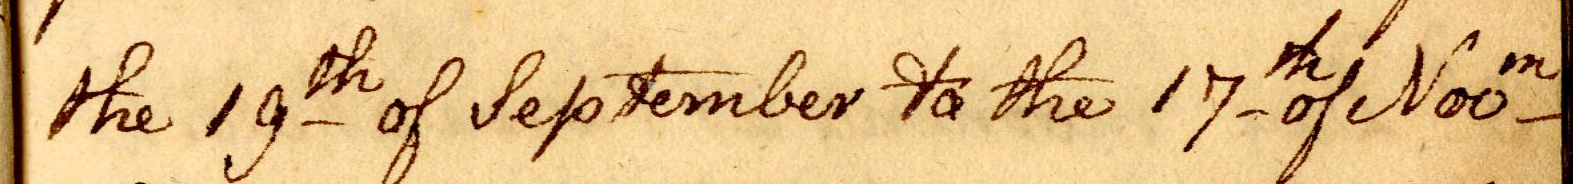the 19^th of September to the 17^th of Nov^m
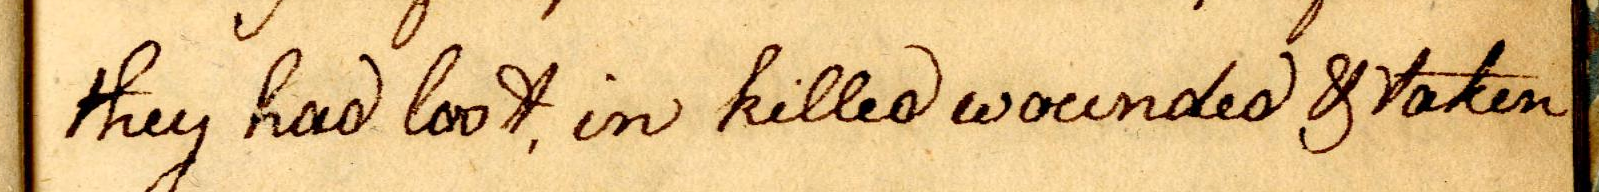they had lost, in killed wounded & taken
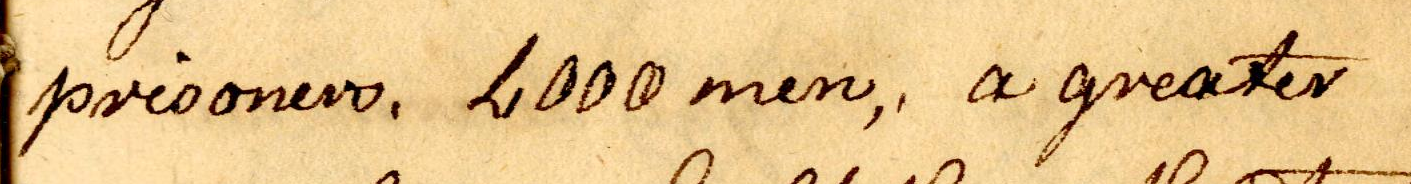prisoners, 4000 men, a greater
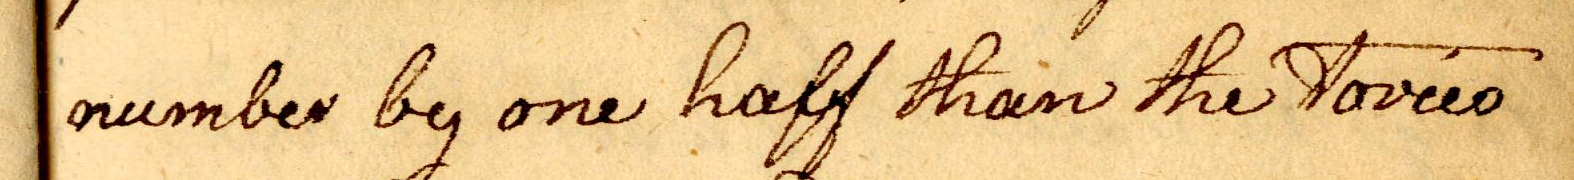number by one half than the tories
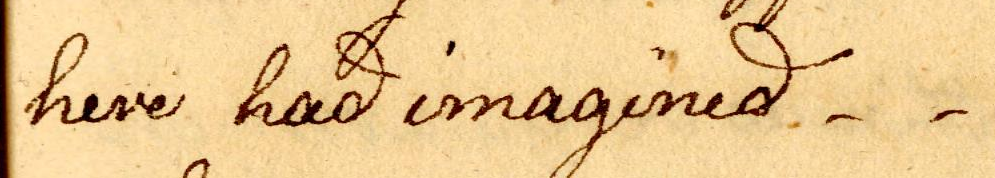here had imagined-
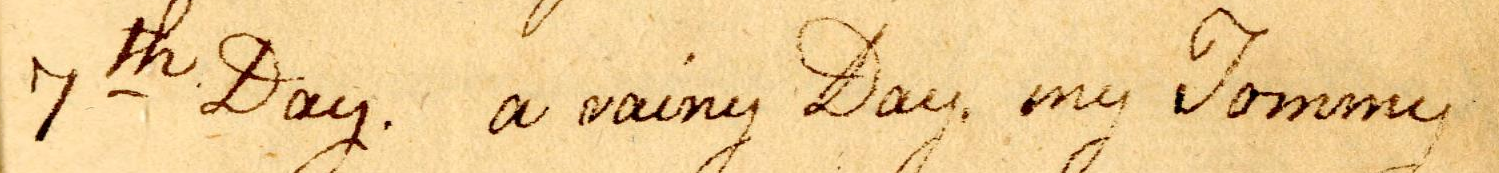7^th Day. a rainy Day, my Tommy
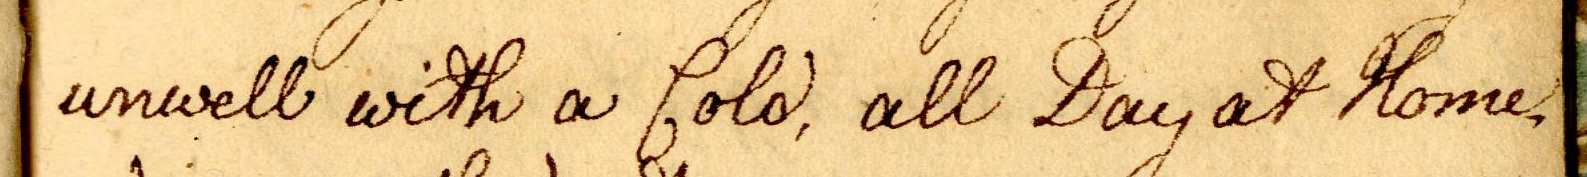unwell with a Cold, all Day at Home
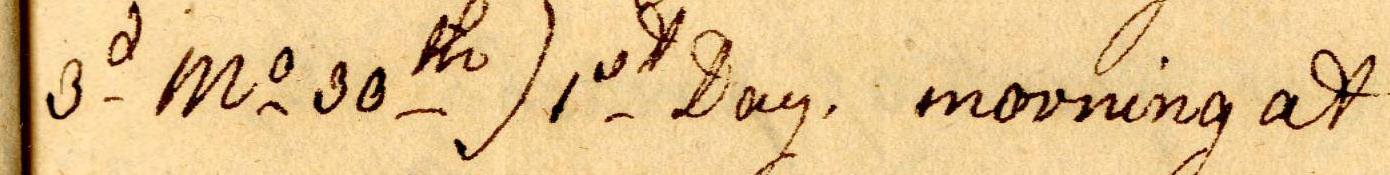3^d M^o 30^th ) 1^st Day, morning at
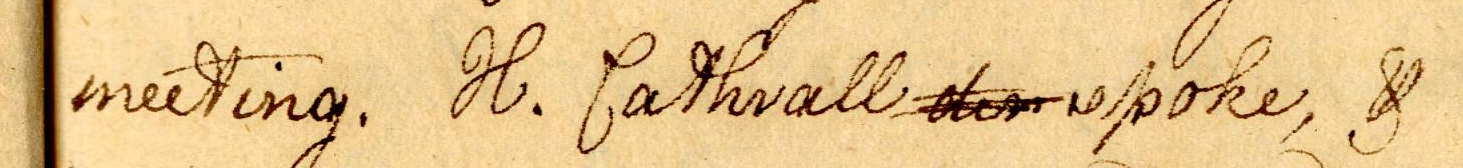meeting. H. Cathrall [dir] spoke, &
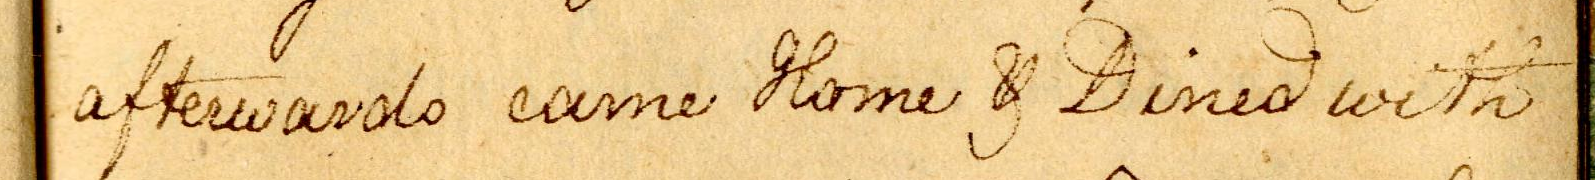afterwards came Home & Dined with
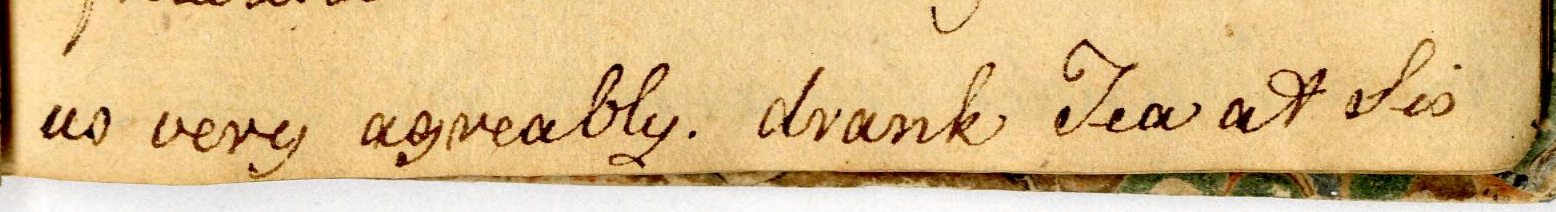us very agreably. drank Tea at Sis
